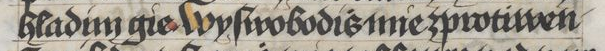hladím gie.Wywobodiṡ mie zprotiwen¬
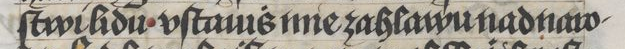ſtwí lidu.uſtaviṡ mie zahlawu nad naro¬
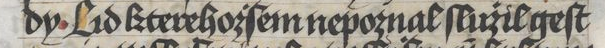dy.Lid kterehožſem nepoznal lužil geſt
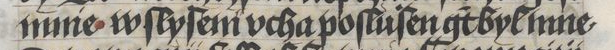mnie.w ſlyẛeni ucha luẛen ḡt byl mne.
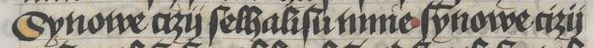Synowe cizij u nmie.ſynowe cizij
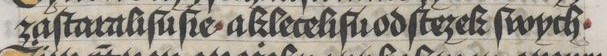zaſtaraliſu ſie.a kleceliſú odſtezek ſwych.
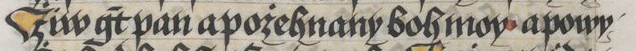Żiw ḡt pan a pożehnaný boh moy.a powy¬
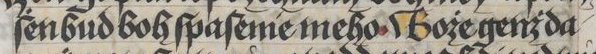ẛen bud boh ſpaſeníe meho.Boże genž da¬
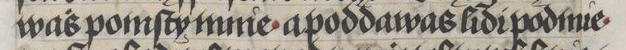waṡ pomſty mnie.a poddawas lidi podmie.
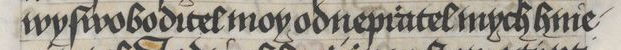wyſwoboditel moy odnepṙatel mych hnie¬
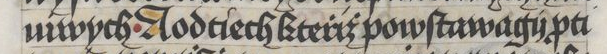viwych.Aod tiech kteṙiż powſtawagij.ꝓti
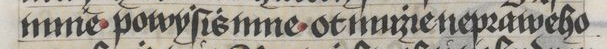mnie.powyẛiṡ mne.ot mużie nepraweho
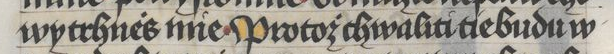wytrhneṡ mie.Protoż chwaliti tie budu w
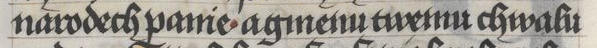narodech panie.a gmenu twemu chwalu
